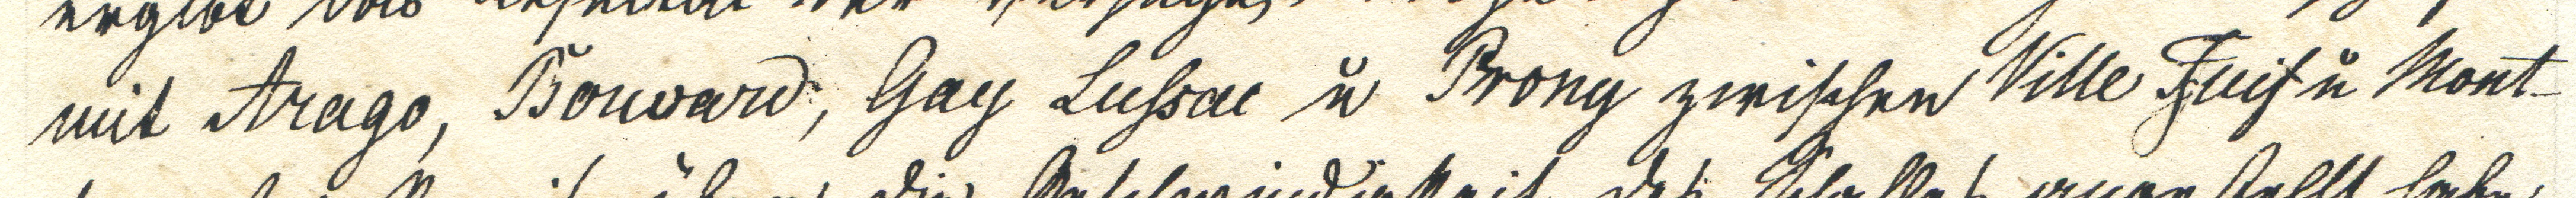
mit Arago, Bouvard, Gay Lussac u Prony zwischen Ville-Juif u Mont-
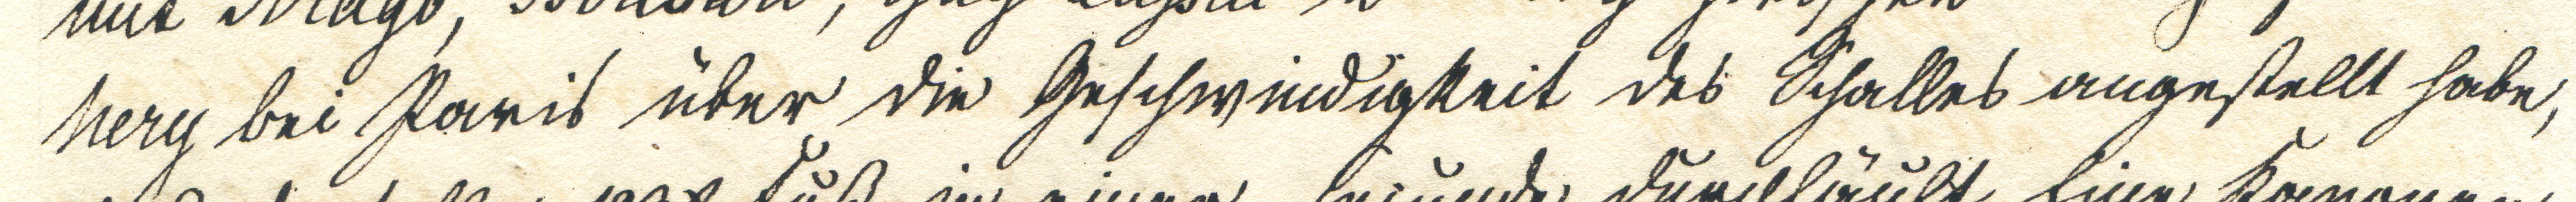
hery bei Paris über die Geschwindigkeit des Schalles angestellt habe,
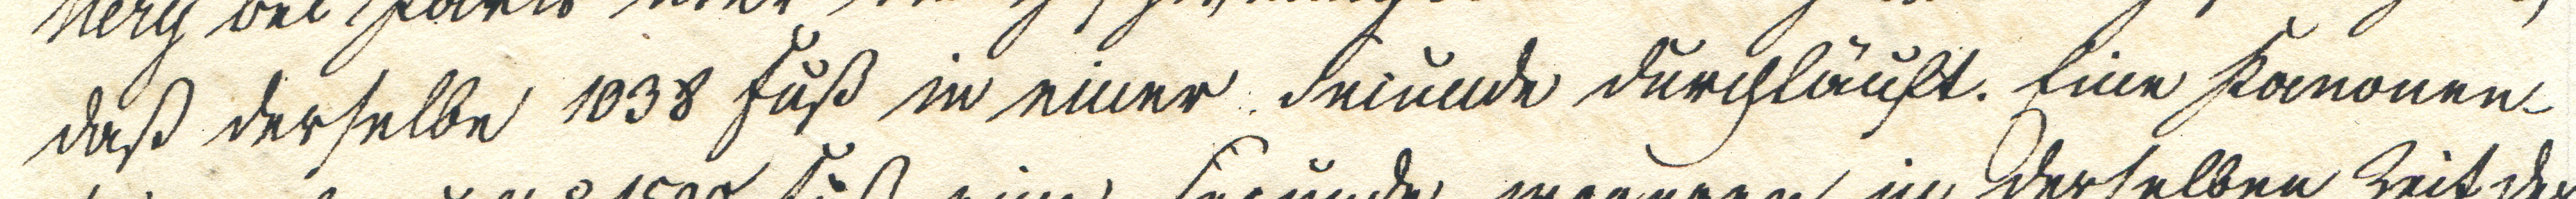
daß derselbe 1038 Fuß in einer Secunde durchläuft. Eine Kanonen-
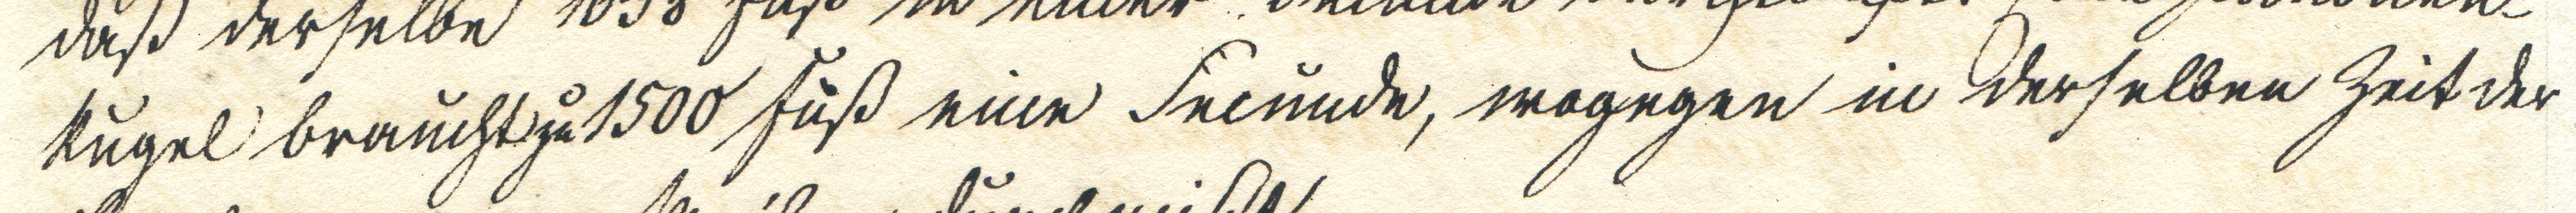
kugel braucht zu 1500 Fuß eine Secunde, wogegen in derselben Zeit der
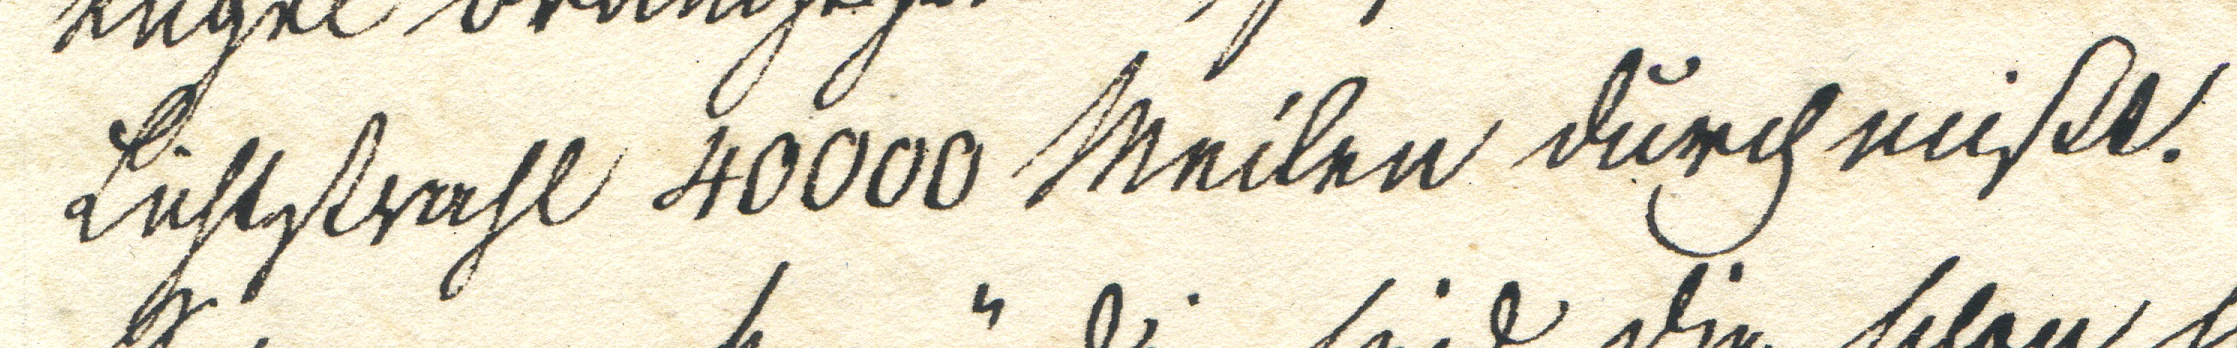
Lichtstrahl 40000 Meilen durchmißt.
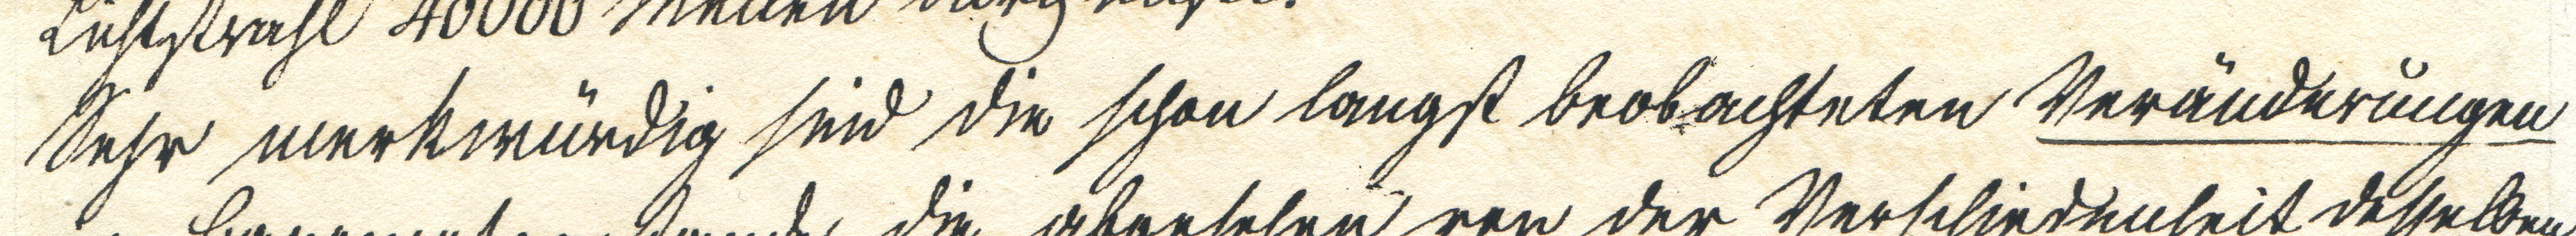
Sehr merkwürdig sind die schon langst beobachteten Veränderungen
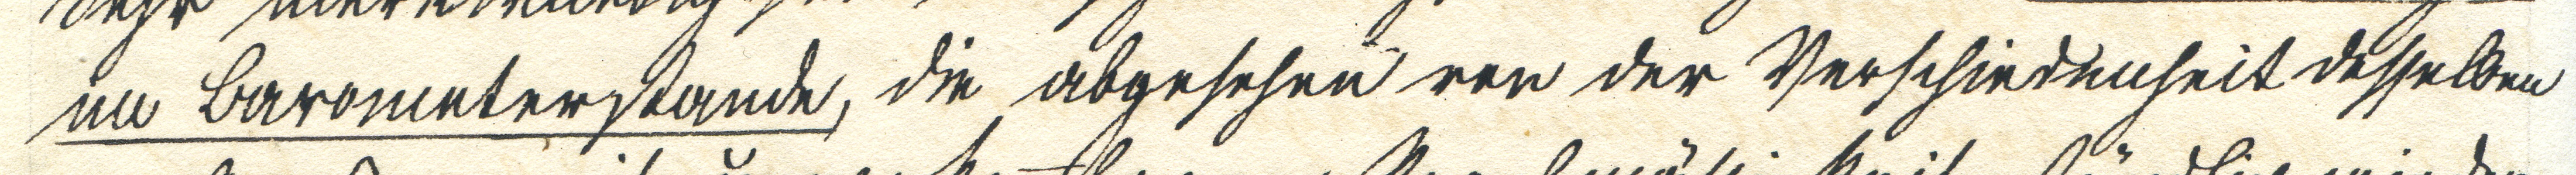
im Barometerstande, die abgesehen von der Verschiedenheit desselben
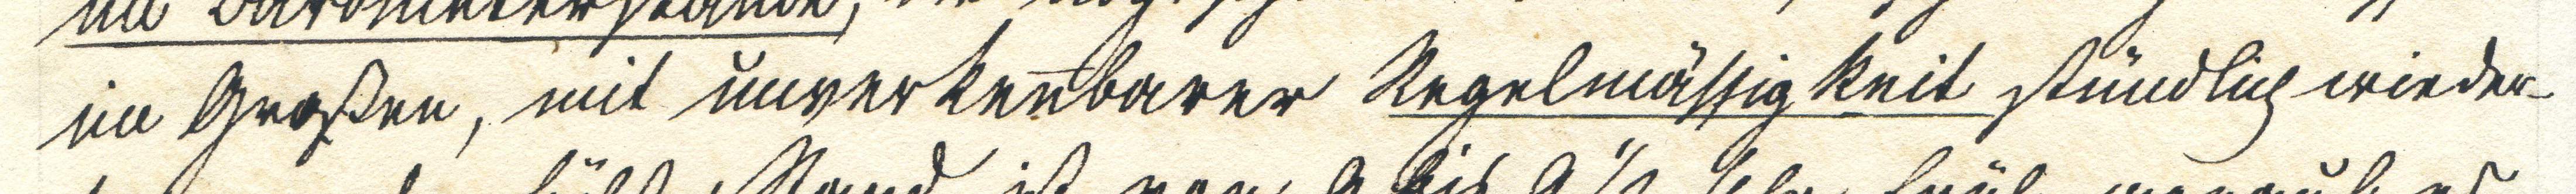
im Großen, mit unverkeñbarer Regelmässigkeit stündlich wieder-
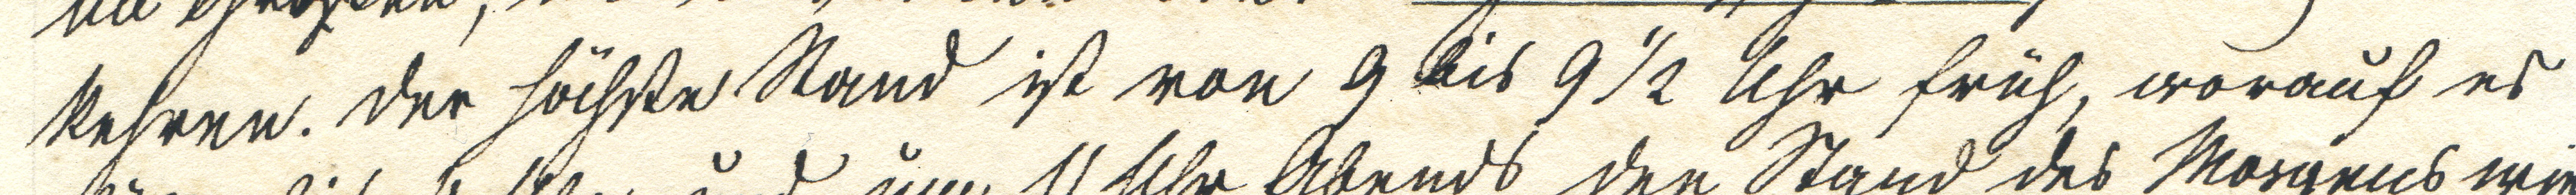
kehren. Der höchste Stand ist von 9 bis 9½ Uhr früh, worauf es
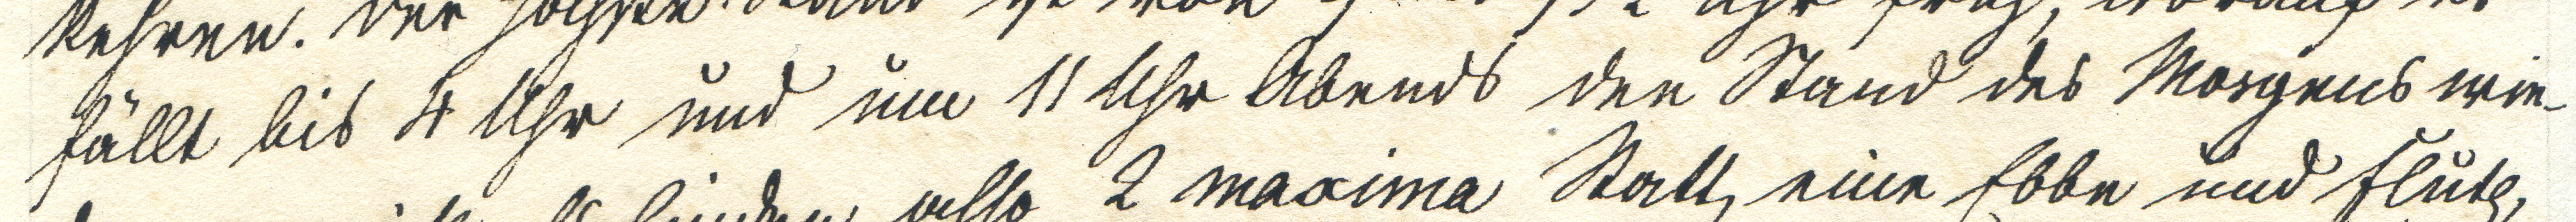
fällt bis 4 Uhr und um 11 Uhr Abends den Stand des Morgens wie-
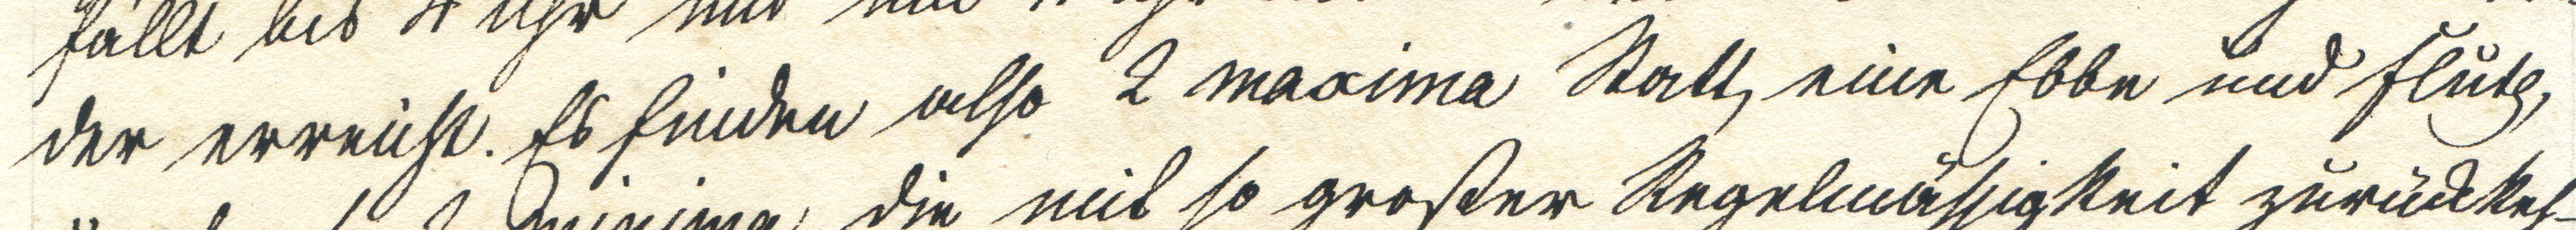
der erreicht. Es finden also 2 maxima Statt, eine Ebbe und Fluth,
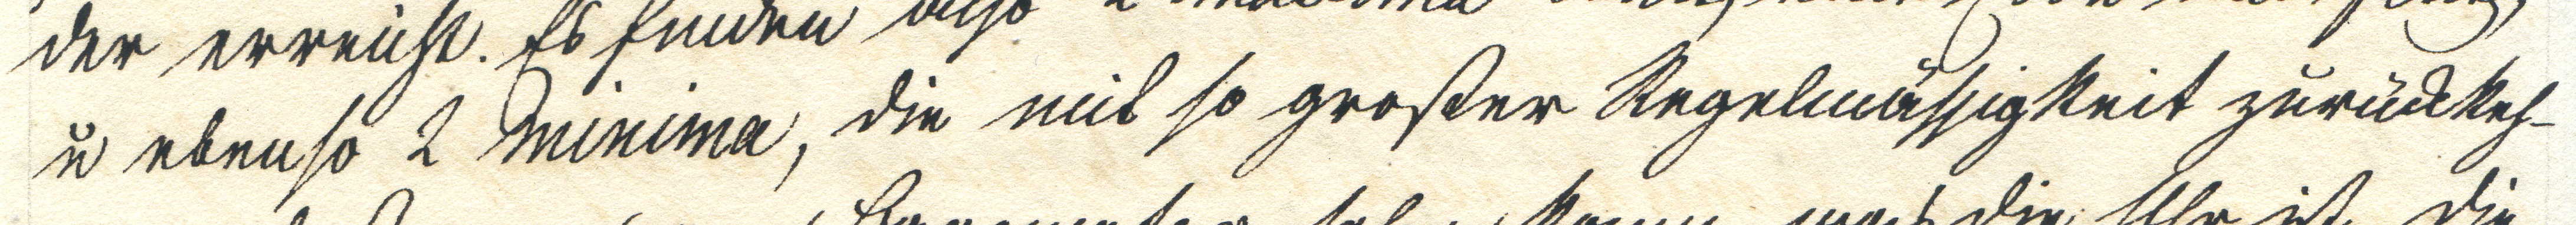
u ebenso 2 minima, die mit so großer Regelmässigkeit zurückkeh-
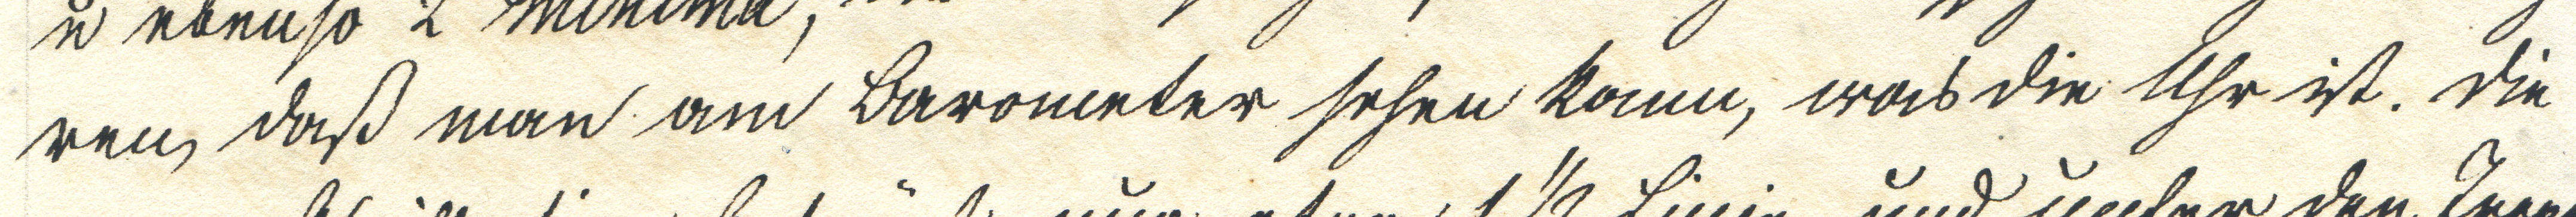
ren, daß man am Barometer sehen kann, was die Uhr ist. Die
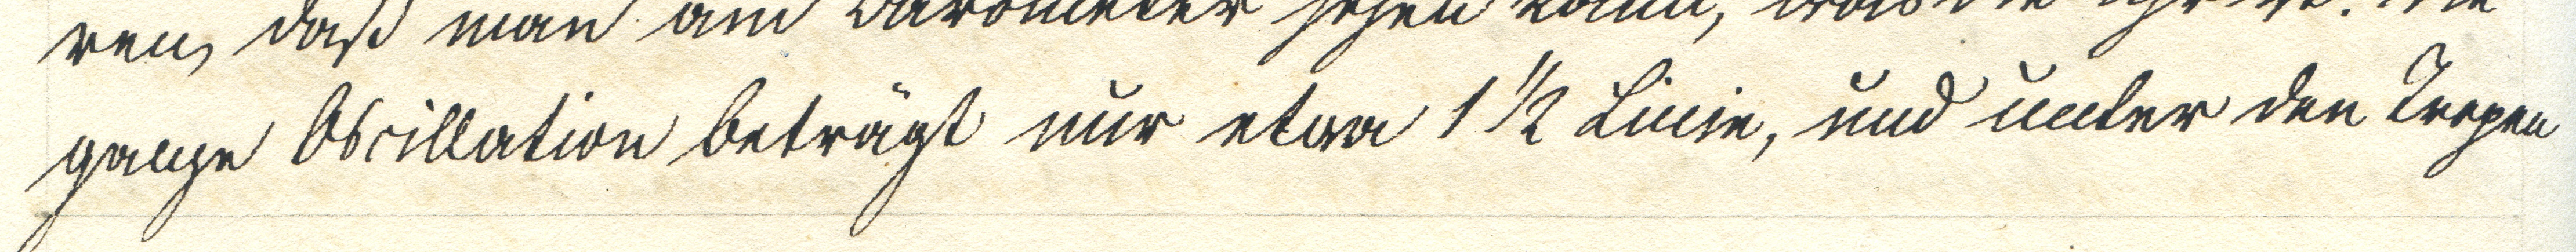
ganze Oscillation beträgt nur etwa 1½ Linien, und unter den Tropen
